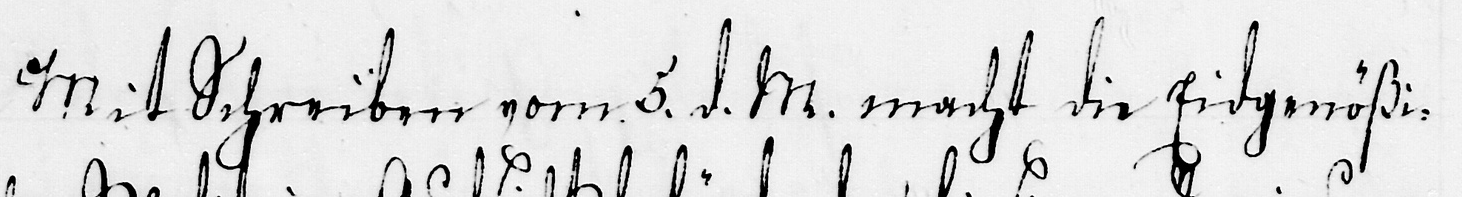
Mit Schreiben vom 5. d. M. macht die Eidgenößis¬
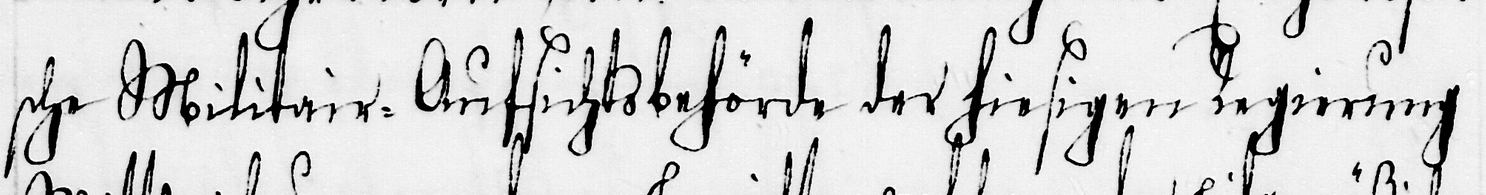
che Militair-Aufsichtsbehörde der hiesigen Regierung
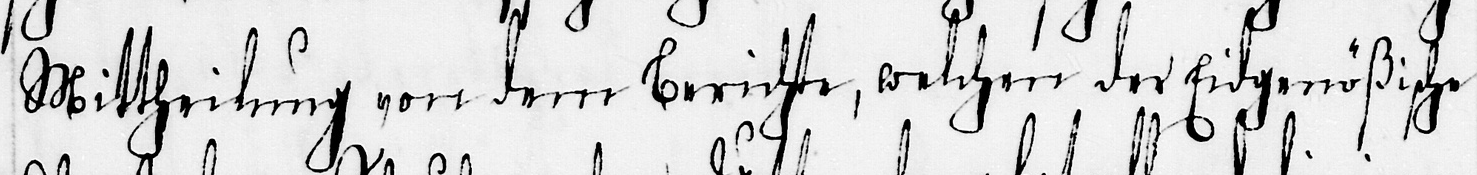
Mittheilung von dem Berichte, welchen der Eidgenößische
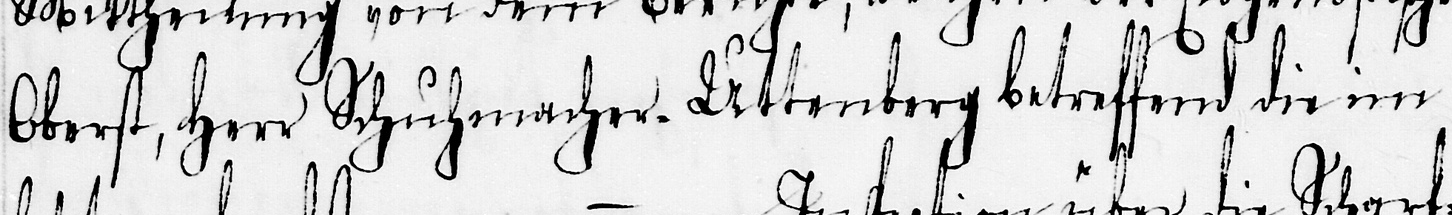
berst, Herr Schuhmacher-Uttenberg betreffend die im
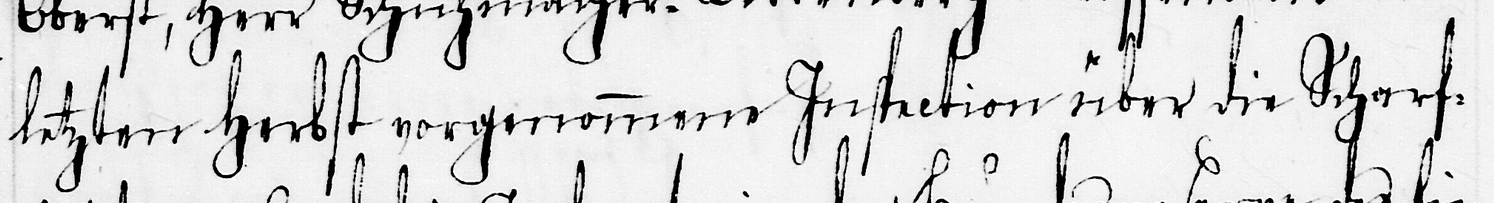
letzten Herbst vorgenommene Inspection über die Scharf¬
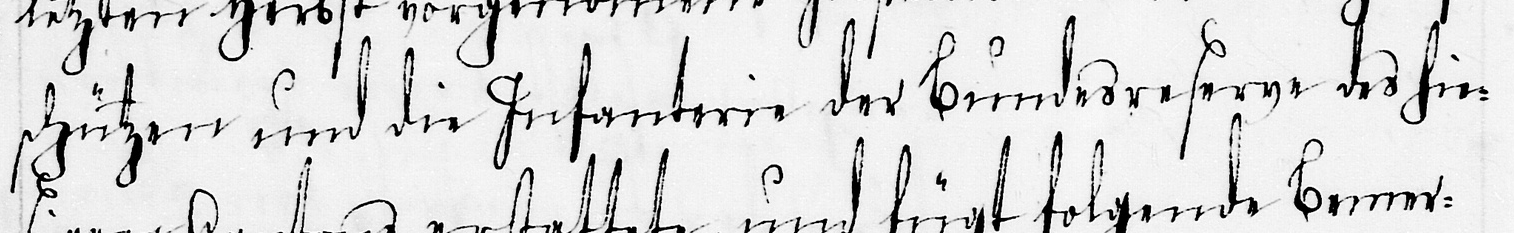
schützen und die Infanterie der Bundesreserve des hie¬
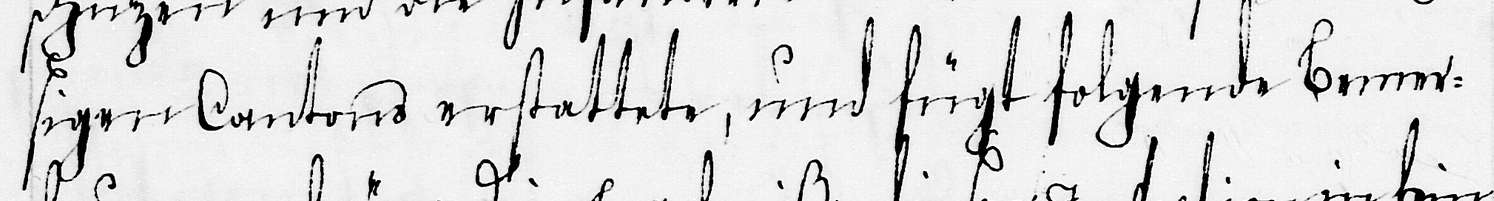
sigen Cantons erstattete, und fügt folgende Bemer¬
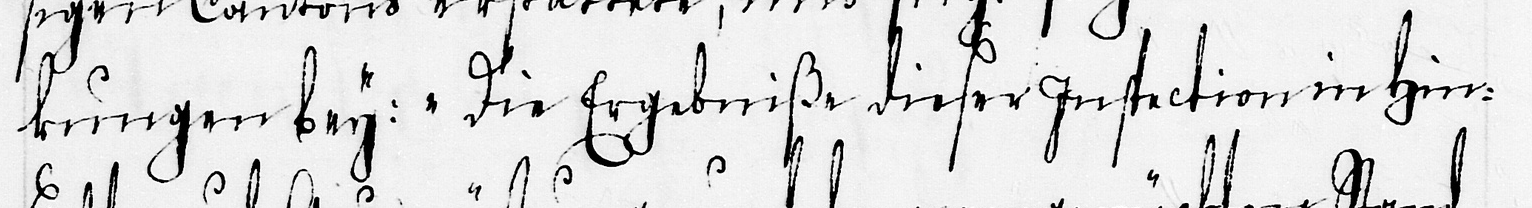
kungen bey: „Die Ergebniße dieser Inspection in Hin¬
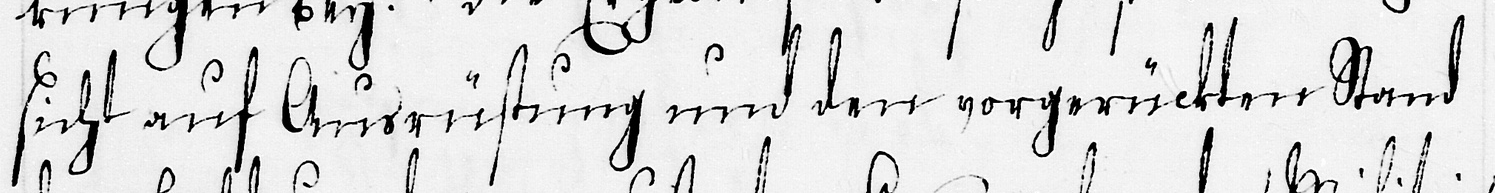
sicht auf Ausrüstung und den vorgerückten Stand
